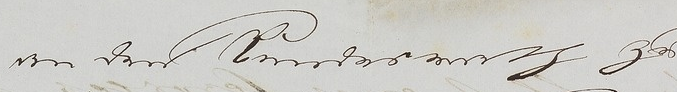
an den Bundesrath zu
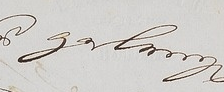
gelangen,
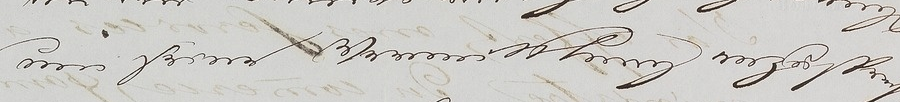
um seine Vermittlung anzusprechen.
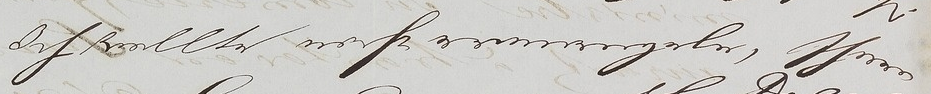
Ich wollte nicht ermangeln, Ihnen
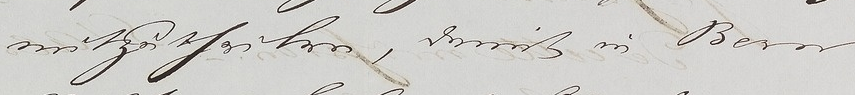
mitzutheilen, damit in Bern
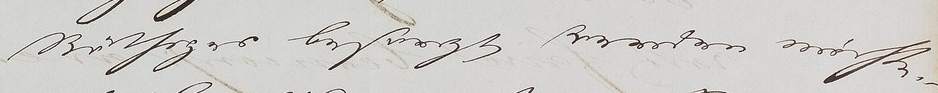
Richtiges besorgt werden möchte. –
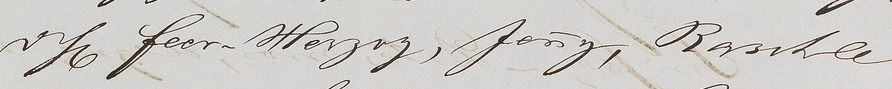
Die Herrn Feer-Herzog, Jenny, Raschle
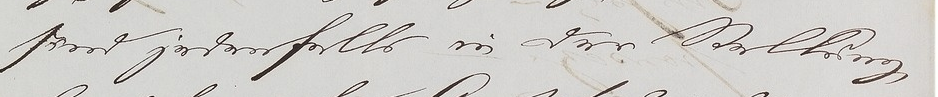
sind jedenfalls in der Stellung,
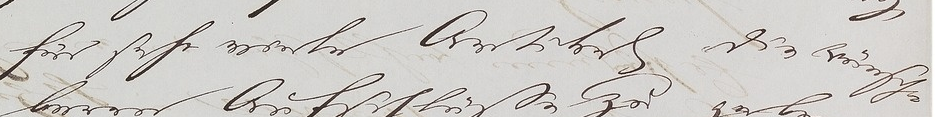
für sehr viele Artikel die wünsch-
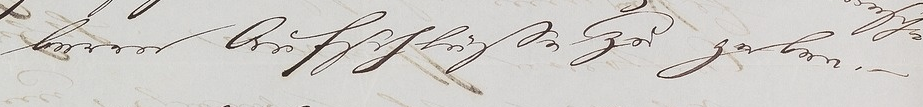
baren Aufschlüsse zu geben. –
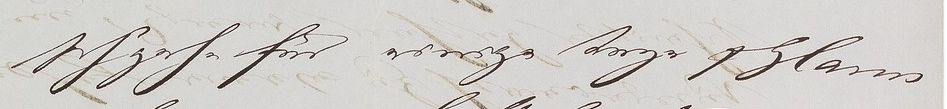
gehe für einige Tage nach Glarus
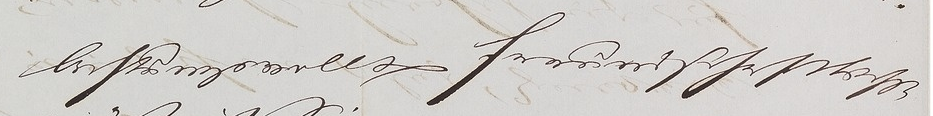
Achtungsvoll & freundschaftlichst
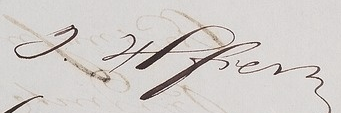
J. H Fierz
